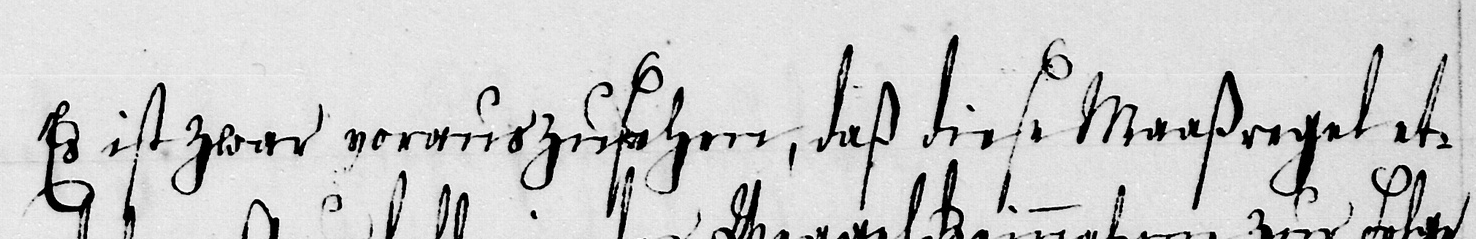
Es ist zwar vorauszusehen, daß diese Maaßregel et¬
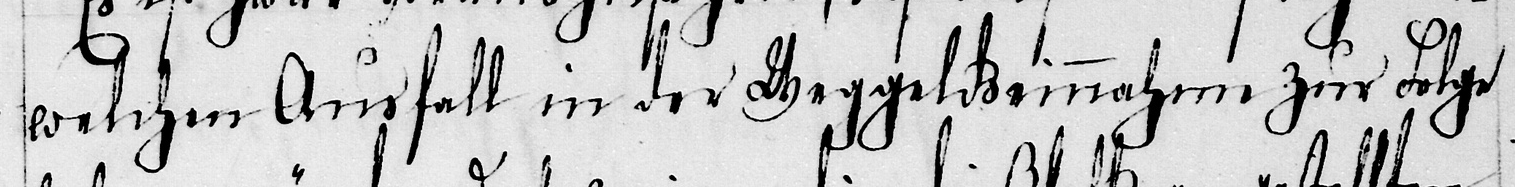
welchen Ausfall in der Weggeldseinnahme zur Folge
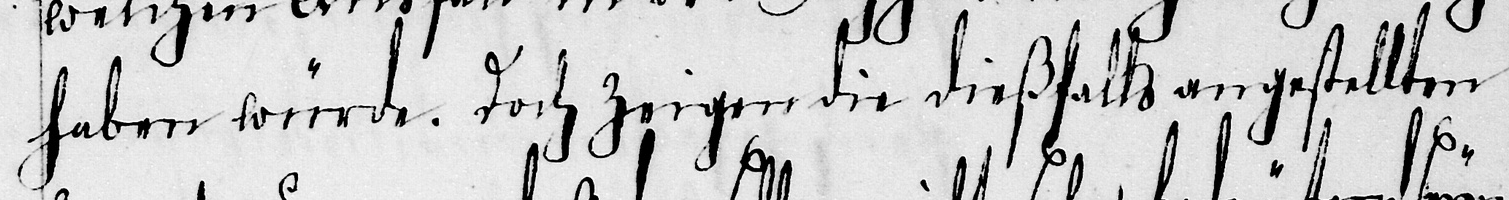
haben würde. Doch zeigen die dießfalls angestellten
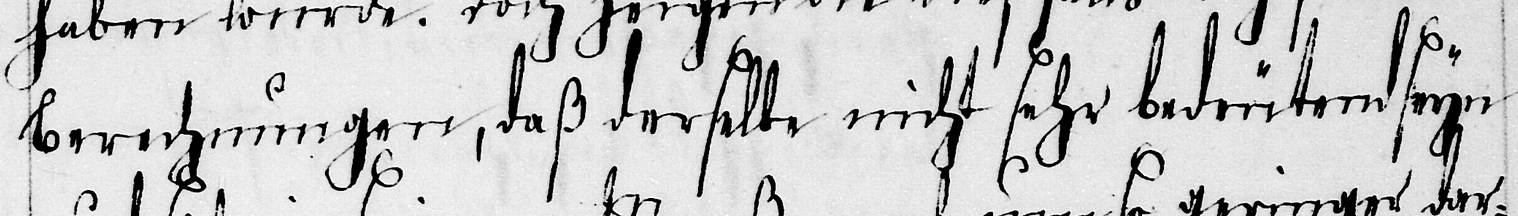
Berechnungen, daß derselbe nicht sehr bedeutend seyn
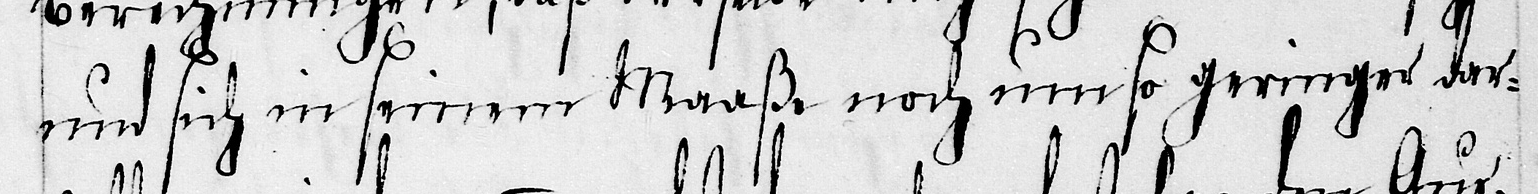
und sich in seinem Maaße noch umso geringer dars¬
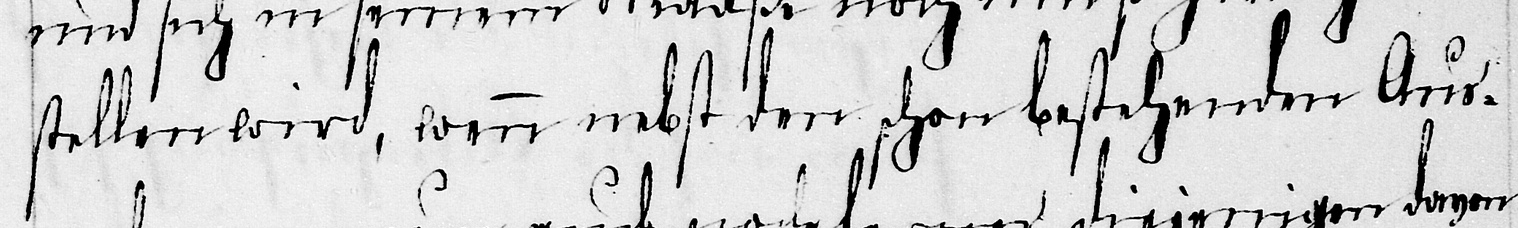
tellen wird, wenn nebst den schon bestehenden Aus¬
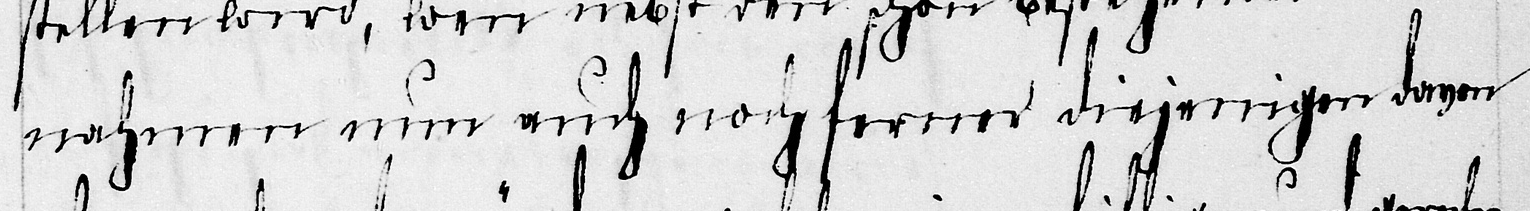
nahmen nun auch noch ferner diejenigen davon
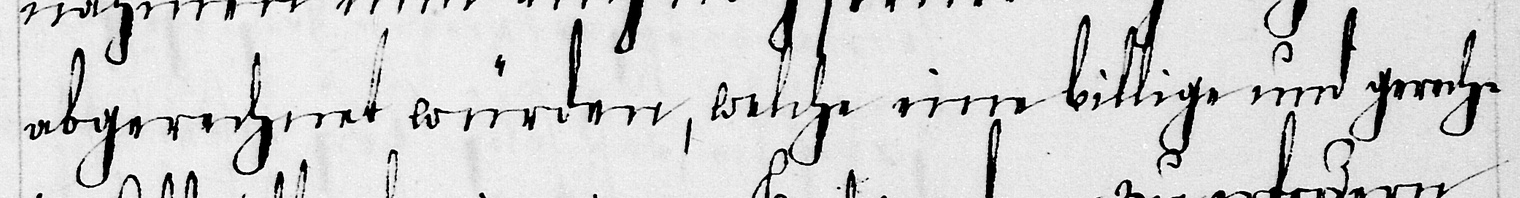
abgerechnet würden, welche eine billige und gerech¬
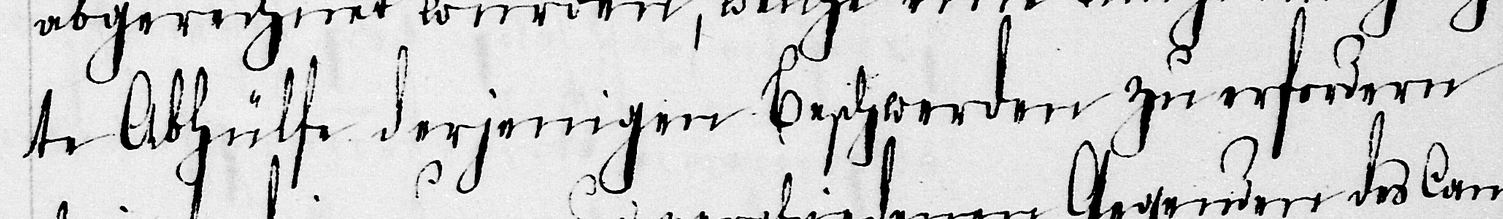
te Abhülfe derjenigen Beschwerden zu erfordern
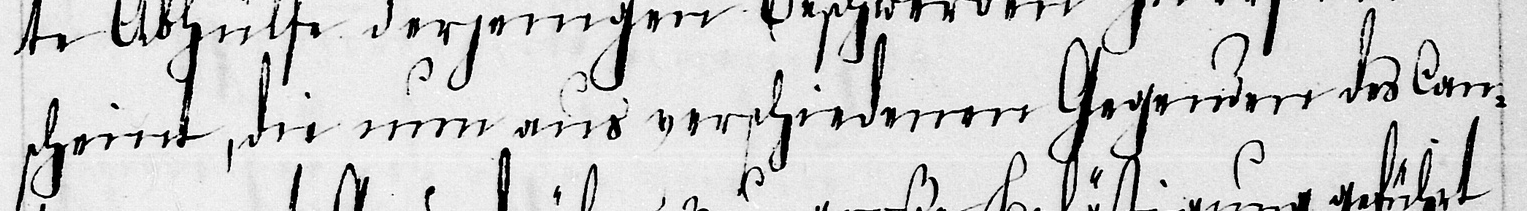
scheint, die nun aus verschiedenen Gegenden des Can¬
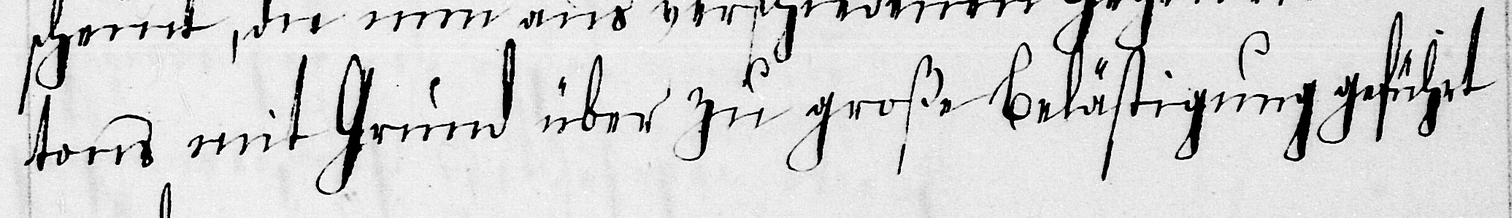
tons mit Grund über zu große Belästigung geführt
